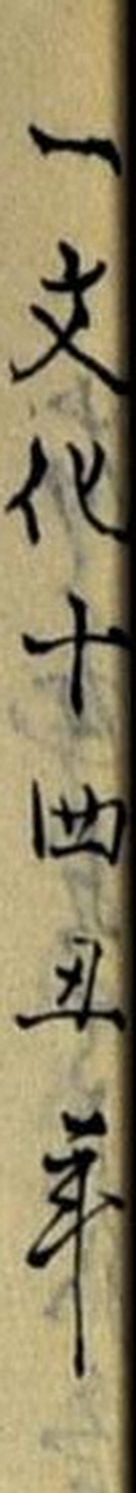一文化十四丑年
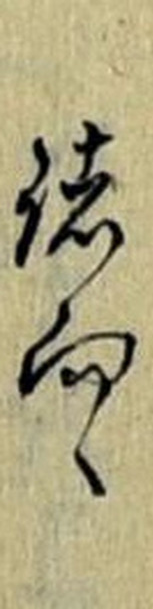諸向へ
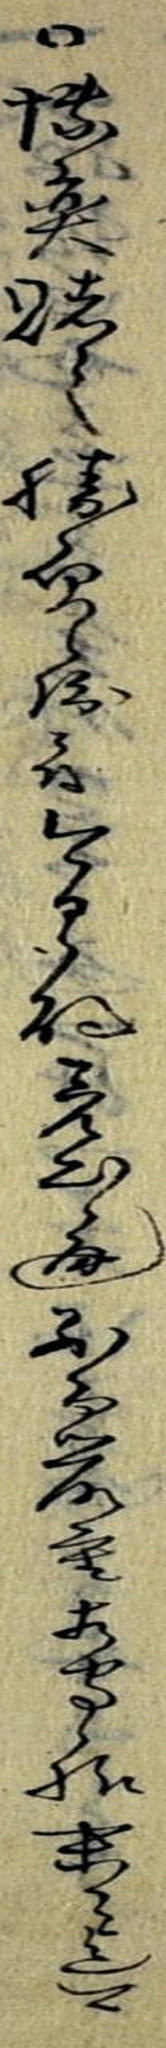○博奕賭之勝負之儀に付今日御触差出候通別而厳重相守候様末々迄可
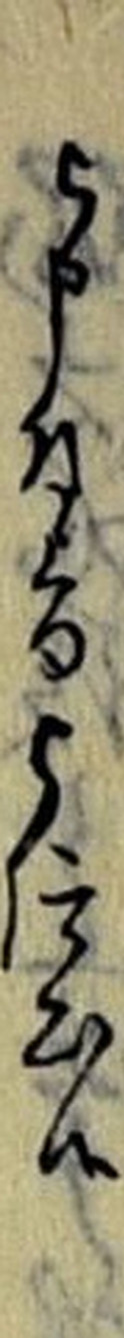被申付旨被仰出候
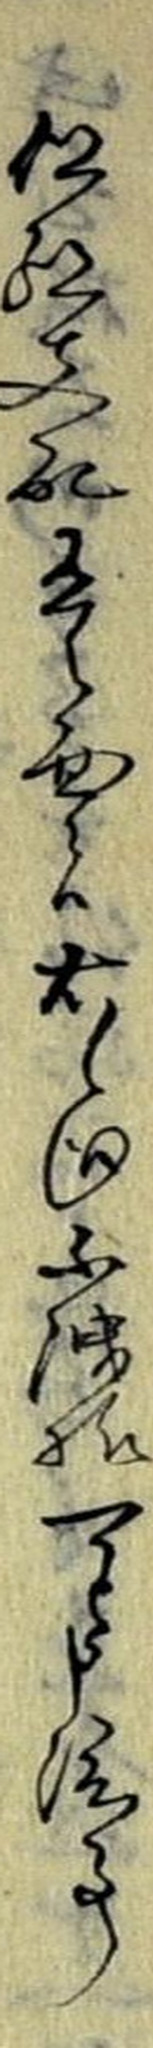但組支配有之面々は右之趣不洩様可被申渡事
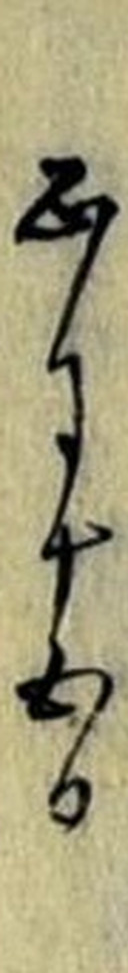正月十五日
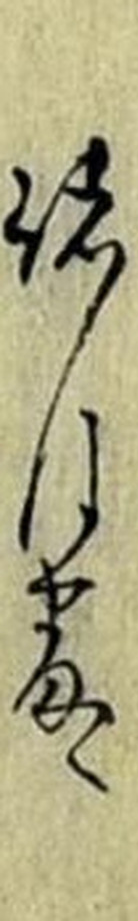諸月番へ
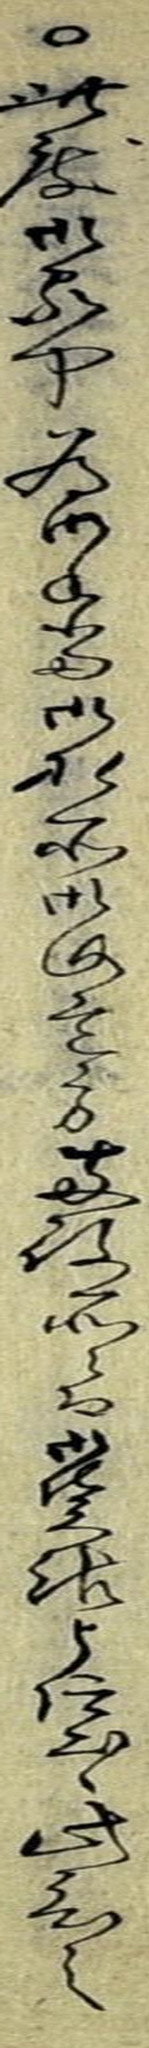○此度御家中為御手当御札所御趣意方両役所に而御貸銀被仰出候此度之
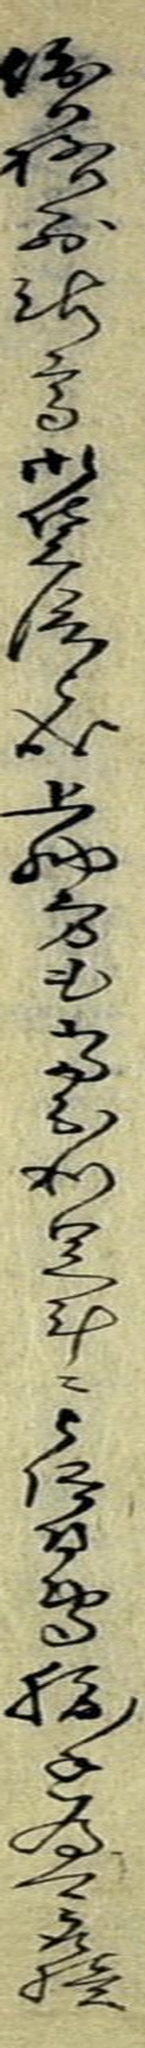儀は各別銀高御貸渡被成上納方も当分利足斗に被仰付専勝手為可取続
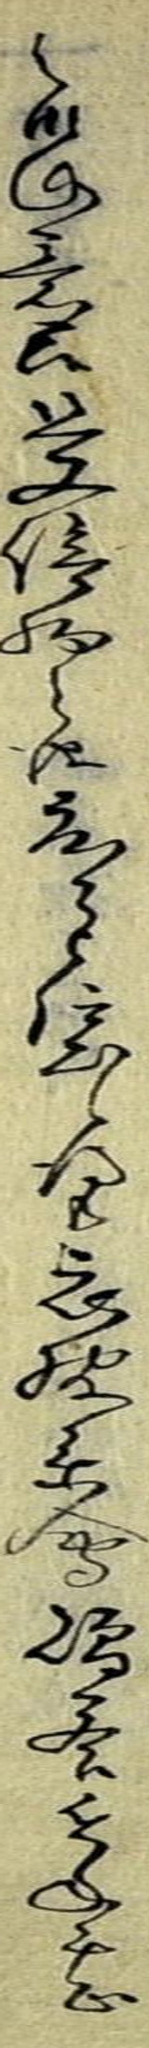之御趣意に候且又倹約之儀度々被仰出候得共衣服参会贈答近年甚
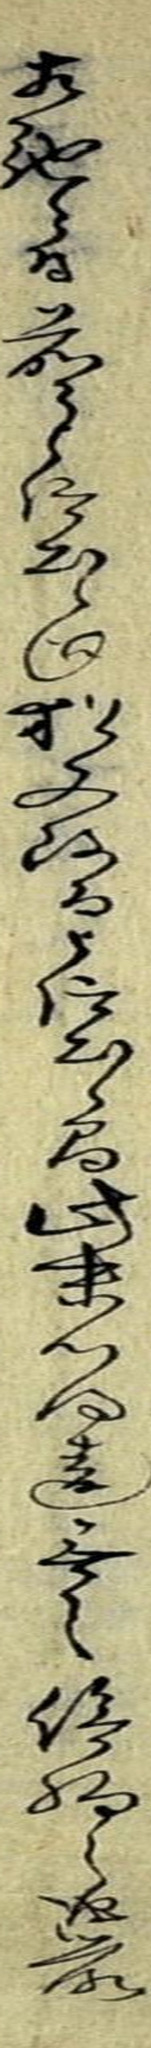相弛候に付前々被仰出候趣猶又改而被仰出候間此末心得違無之倹約之儀厳
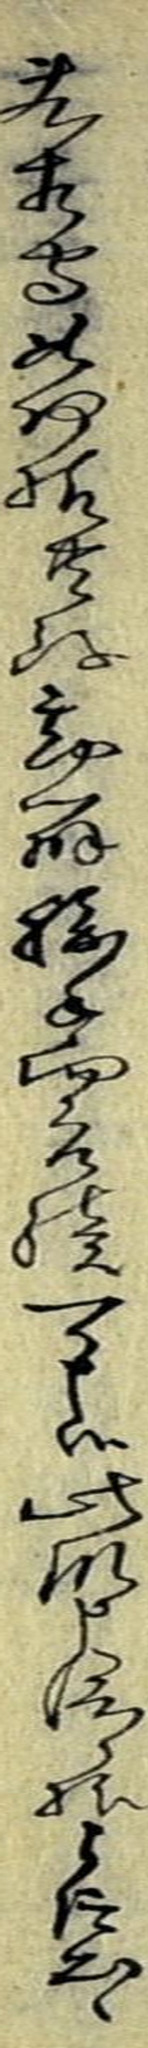敷相守如何様共致勘弁勝手向取続可申候此段申渡候様被仰出候
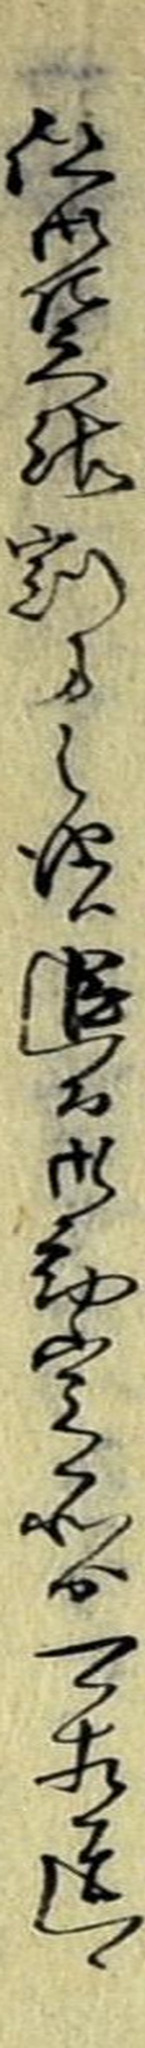但御貸銀割方之儀は追而御勘定所ゟ可相達候
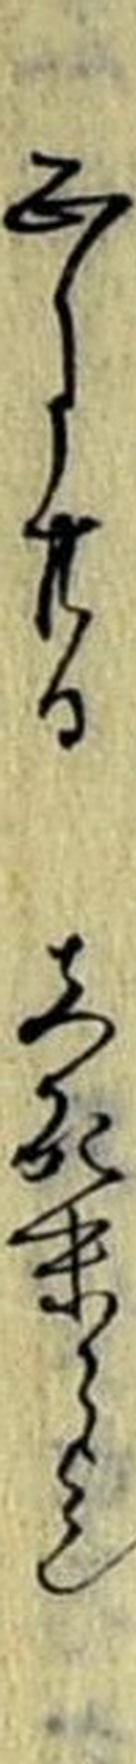正月廿日支配末々迄
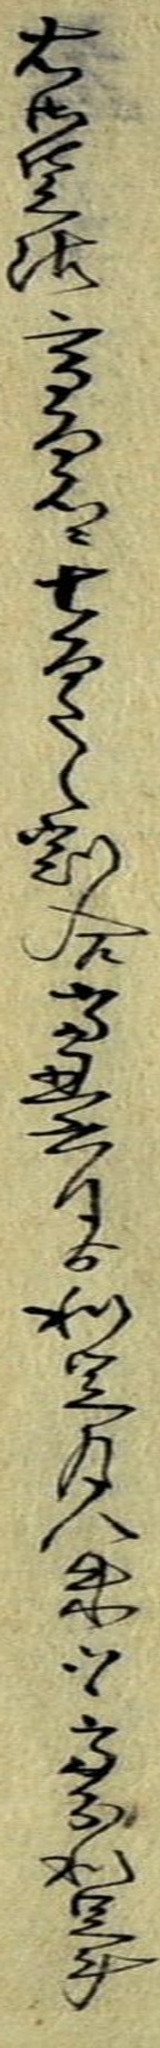右御貸銀高百石に七百匁之割合当丑六月ゟ利足月八朱つヽ当分利足斗

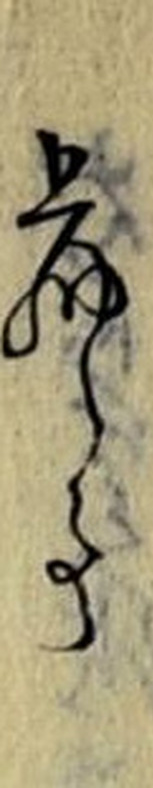上納之事
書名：命令之部 四
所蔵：福井県文書館 Fukui Prefectural Archives
